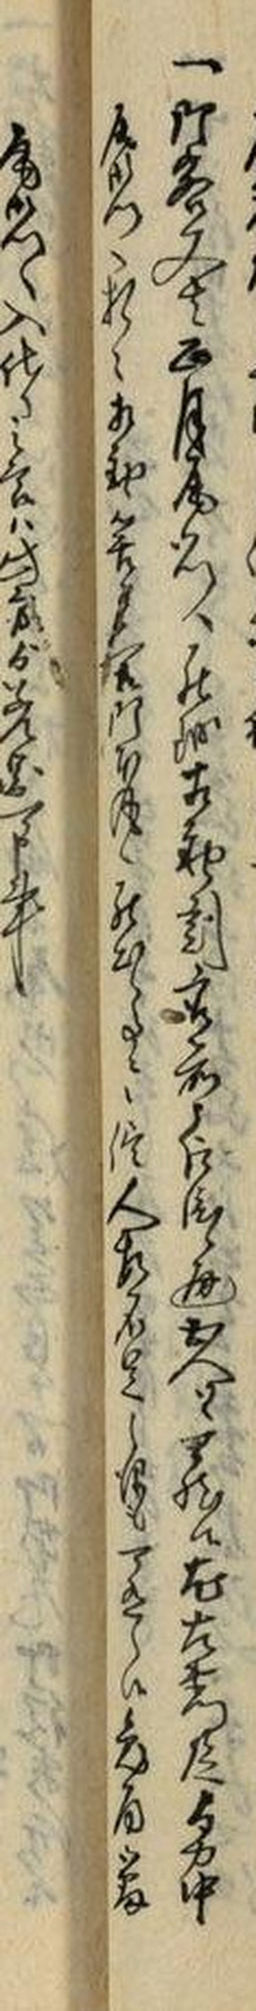瓦御門へ折々相勤候筈ニ候へ共御本丸へ罷出候事ニ候儘人数不足之儀も可有之候兎角御番
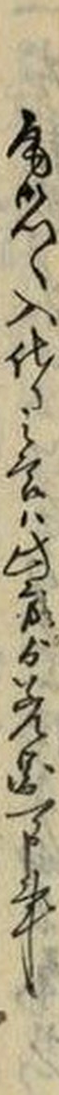瓦御門へ入代り之節ハ此方ゟ差図可申事
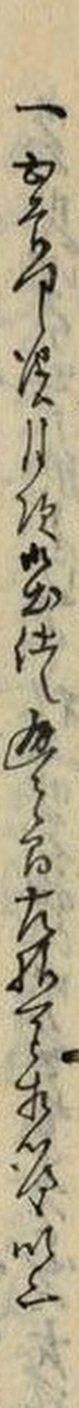一五節句之儀ハ月次御出仕之通候間左様可被相心得候以上
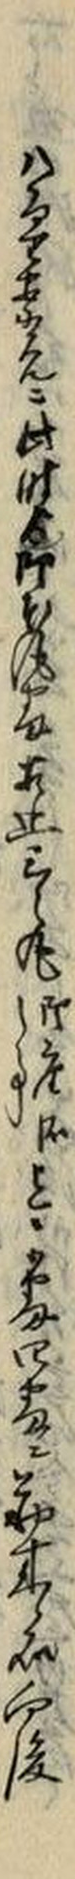八百里案スルニ此時ゟ御本丸番相止三ノ丸御座所迄御番四番ニ勤来候処向後
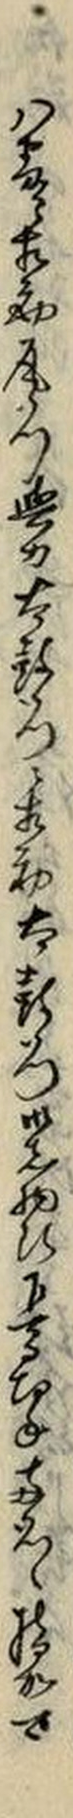八番ニ相勤瓦御門与力太鼓御門ニ相勤太鼓御門御先物頭下馬切手両御門へ指加可
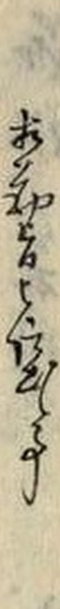相勤旨被仰出候事
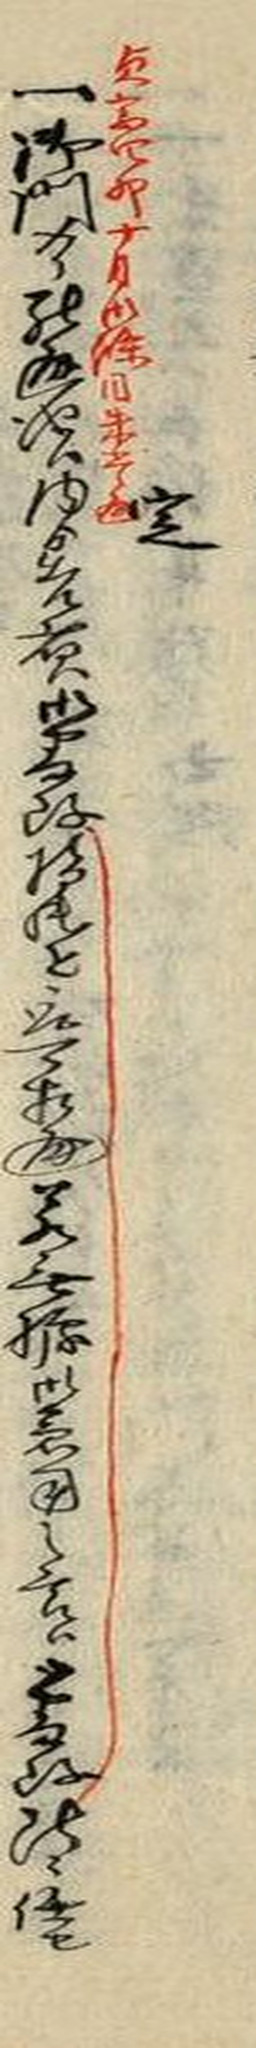一御門〆り罷通儀ハ内ゟ出候者ハ御番改指紙を取可相通若無拠御急用之節ハ御番改断ニ任せ
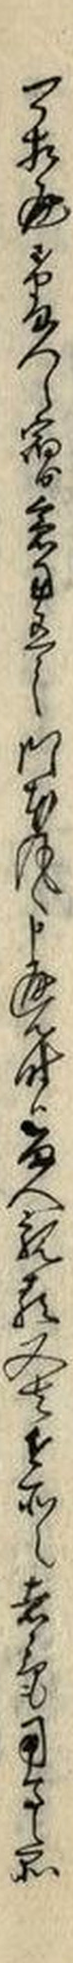可相通御番人之宿ゟ急用有之御本丸へ申通ル時ハ番人親類又者近所之者ニ而も用事之品
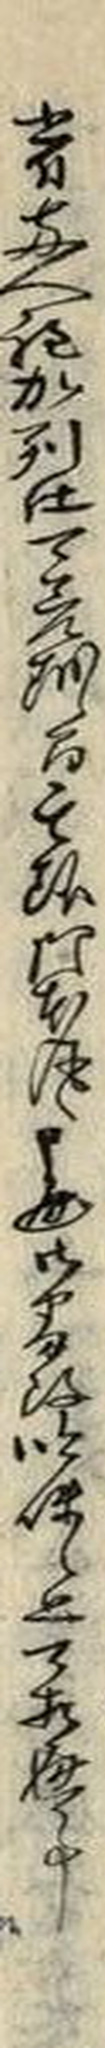書付両人程加判仕可差越候間其趣御本丸へ申通御番改吟味之上可相通事
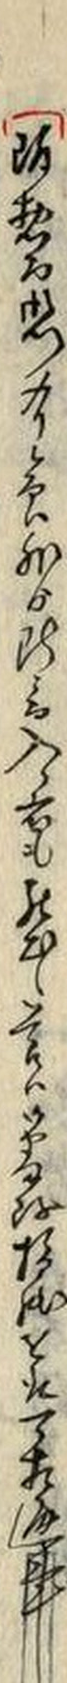附惣而御門〆り候而ハ外ゟ断ニ而入候者も罷出候節ハ御番改指紙を取可相通候
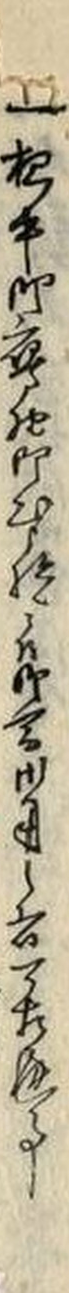一夜中御鷹野御出被遊候ニ付御馬御用之者可相通事
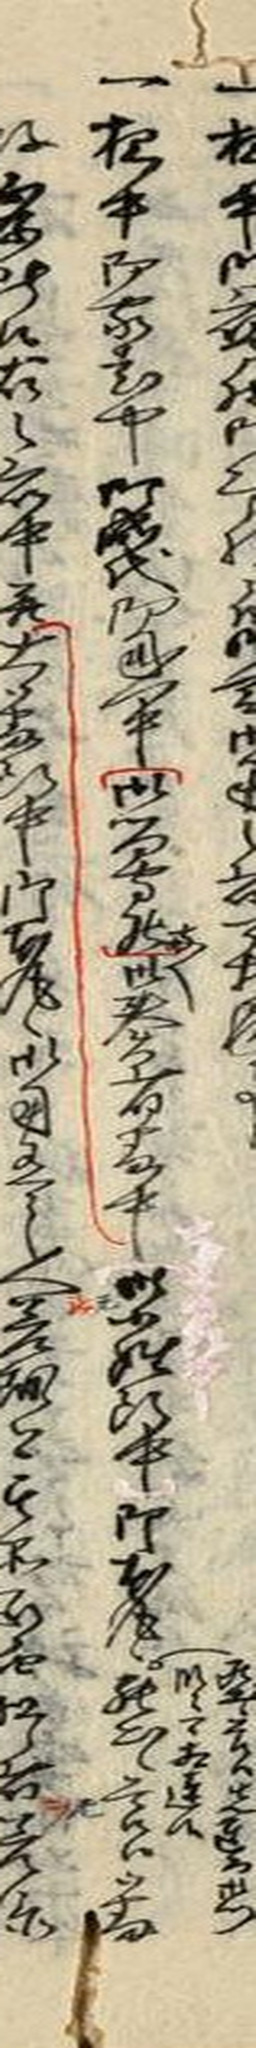改不致断候右之衆中并大番頭中御本丸へ御用有之人差越候ハヽ其品承届組之者差添
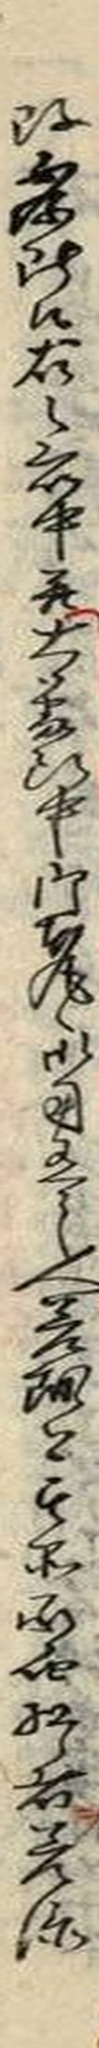改不致断候右之衆中并大番頭中御本丸へ御用有之人差越候ハヽ其品承届組之者差添
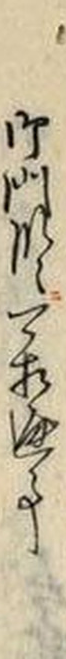御門段々可相通事
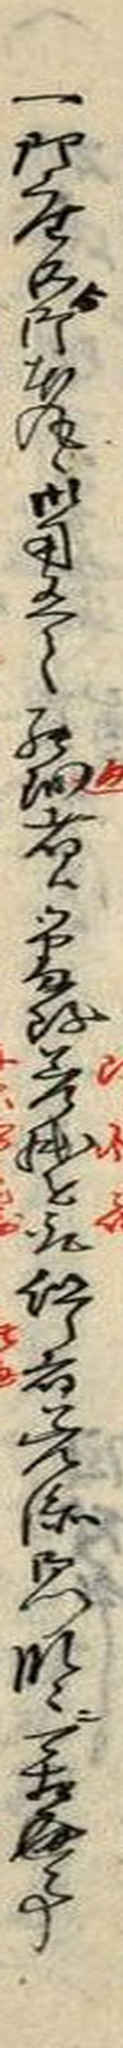一御座所御本丸へ御用有之罷通候者ハ御番改差紙を取組之者差添御門段々ニ可相通事
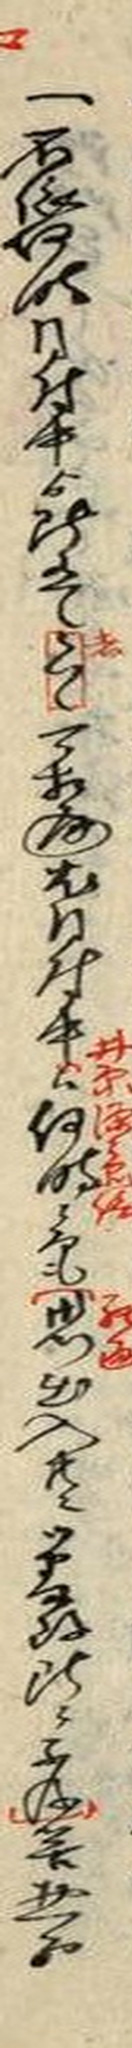一不依何時目付中ゟ断有之者可相通尤目付中井原源兵衛儀ハ何時ニ而も罷通御門出入共ニ御番改断ニ不及筈惣而
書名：御門御櫓之部
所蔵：福井県文書館 Fukui Prefectural Archives
